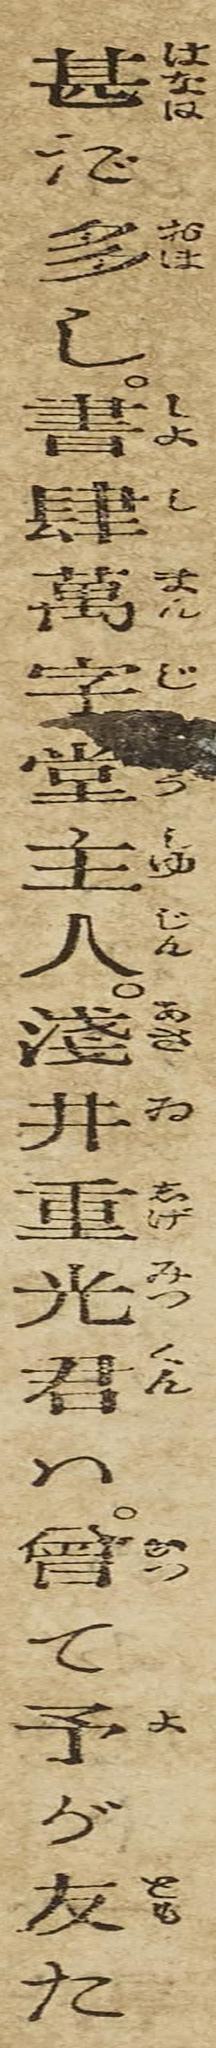甚だ多し。書肆萬字堂主人。淺井重光君は。曾て予が友た
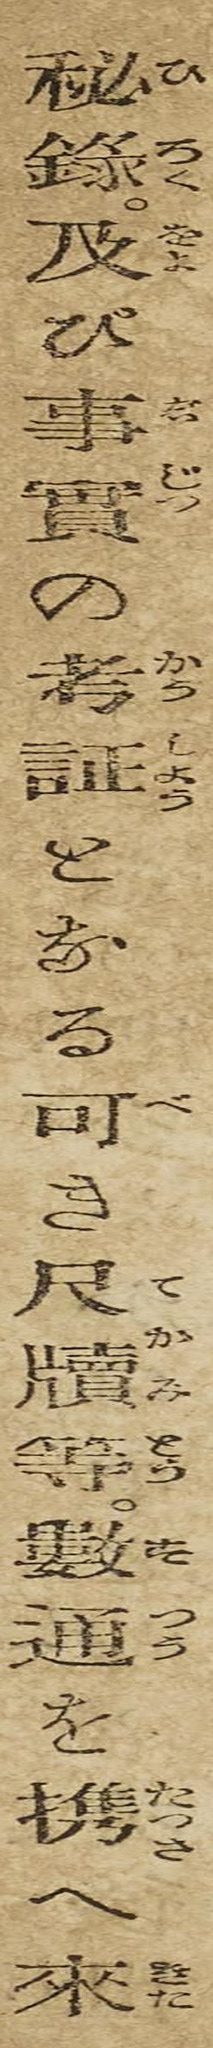秘録。及び事実の考証となる可き尺牘等。数通を携へ来
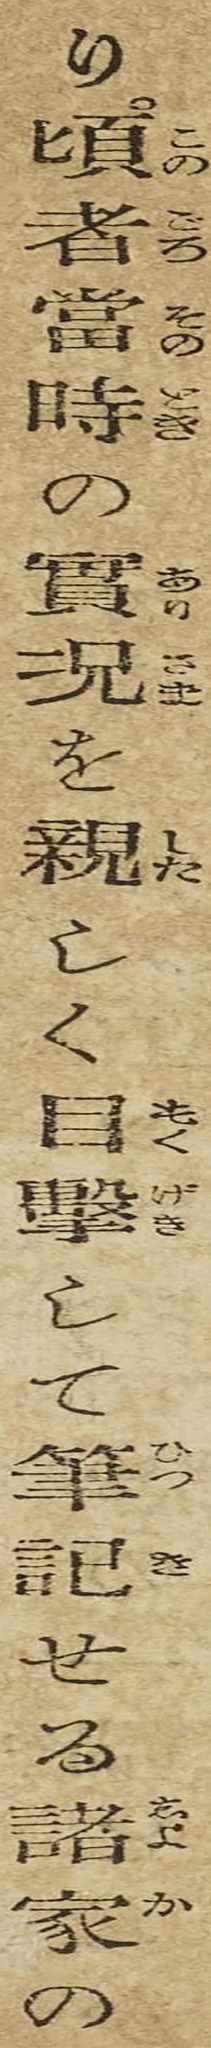り。頃者当時の実況を親しく目撃して筆記せる諸家の
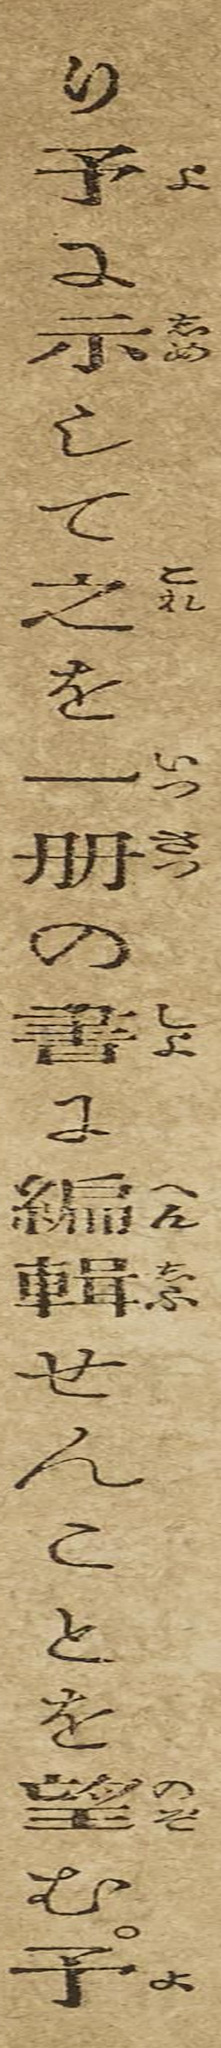り予に示して之を一冊の書に編輯せんことを望む。予

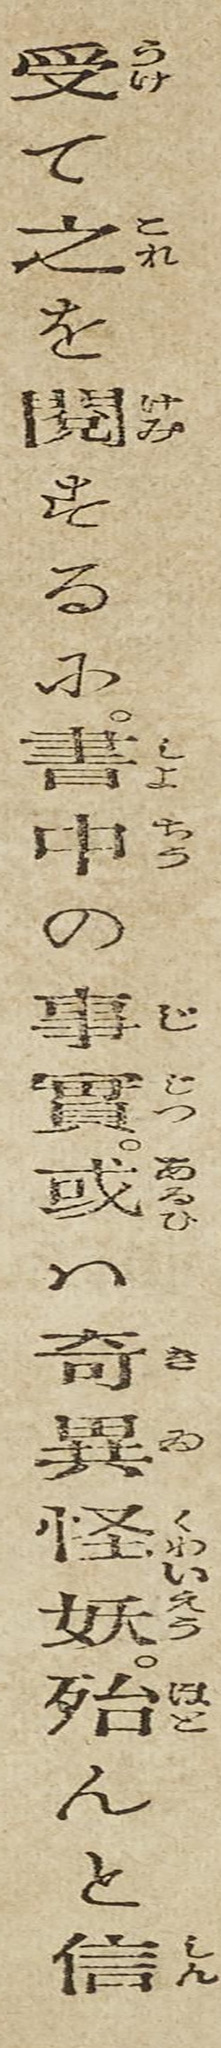受て之を閲するに。書中の事実。或は奇異怪妖。殆んと信
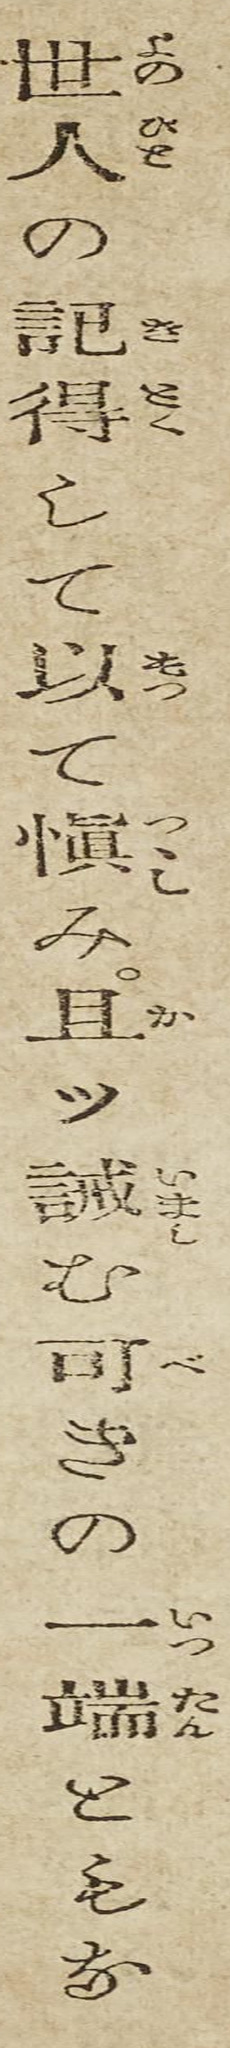世人の記得して以て慎み。且つ誡む可きの一端ともな
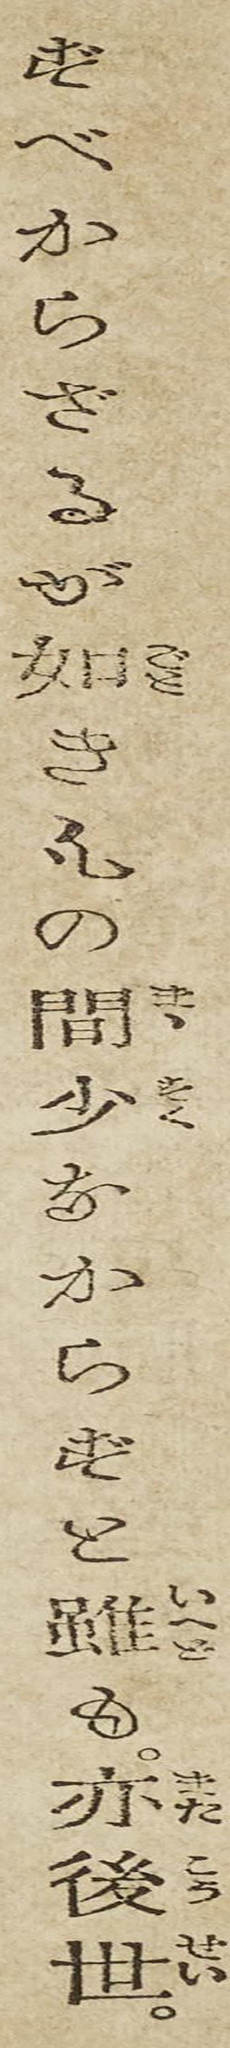ずべからざるが如きもの間少なからずと雖も。亦後世。
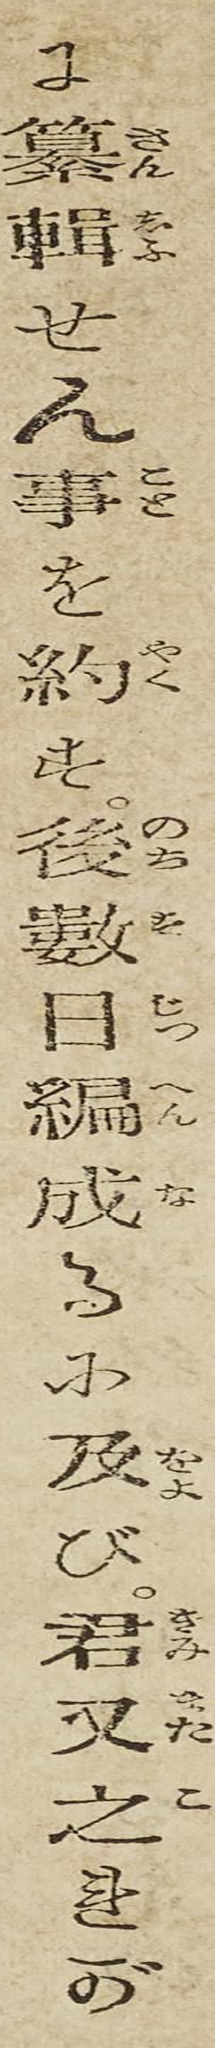に纂輯せん事を約す。後数日編成るに及び。君又之れが
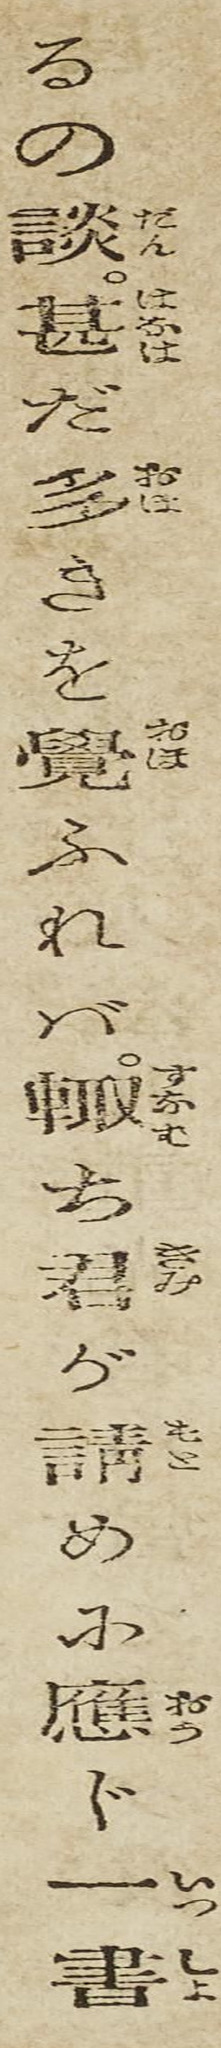るの談。甚だ多きを覚ふれば。輙ち君が請めに応じ一書
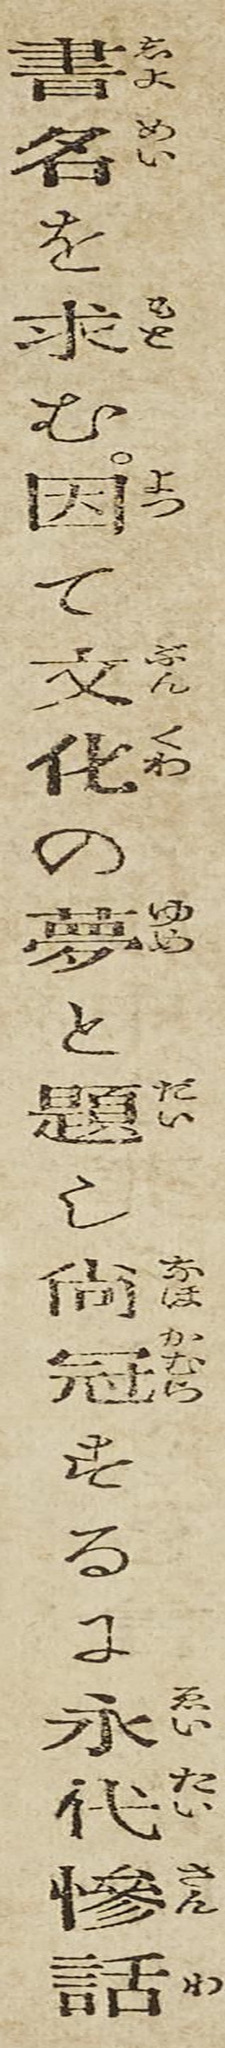書名を求む。因て文化の夢と題し尚冠するに永代惨話
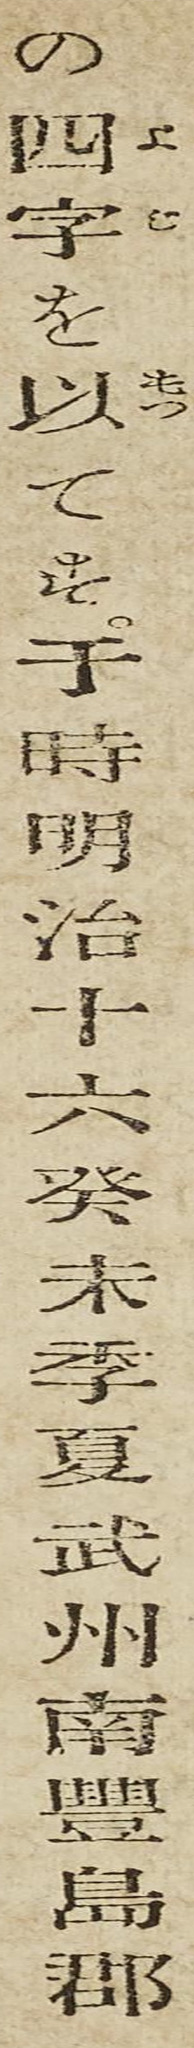の四字を以てす。于時明治十六癸未季夏武州南豊島郡
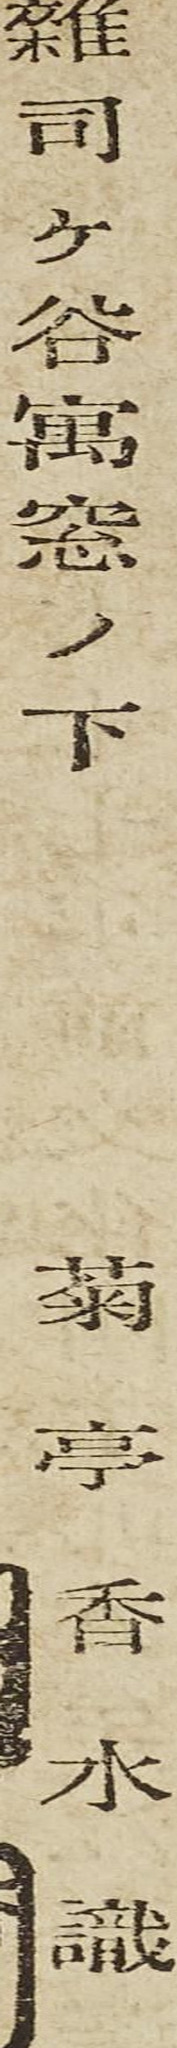雑司ヶ谷寓窓ノ下菊亭香水識
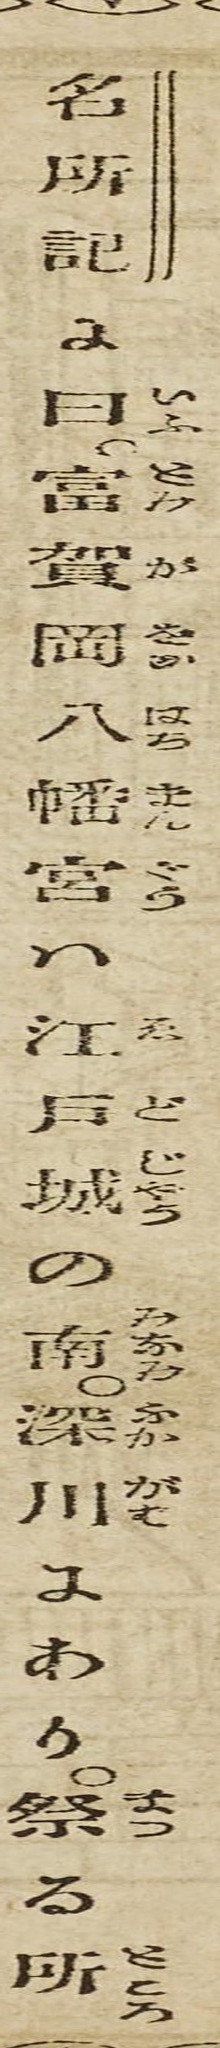名所記に曰。富賀岡八幡宮は江戸城の南。深川にあり。祭る所
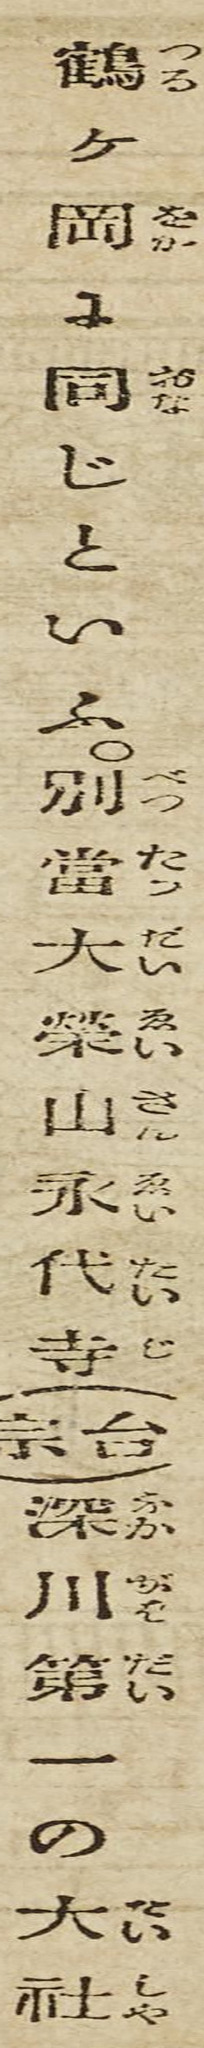鶴ヶ岡に同じといふ。別当大栄山永代寺深川第一の大社
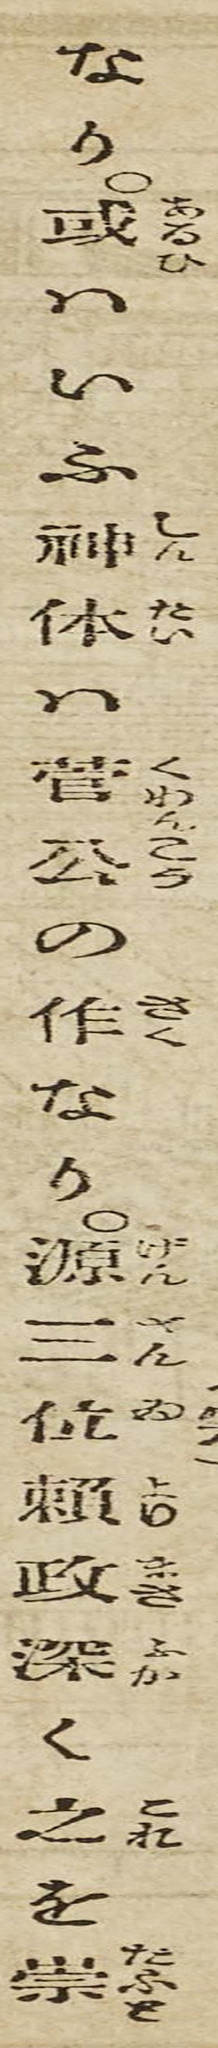なり。或はいふ神体は菅公の作なり。源三位頼政深く之を崇
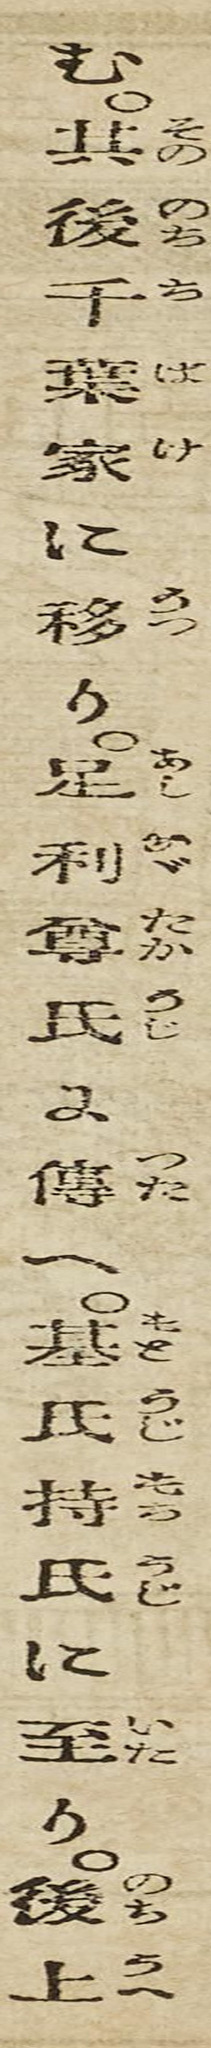む。其後千葉家に移り。足利尊氏に伝へ。基氏持氏に至り。後上
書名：永代惨話　文化の夢　全
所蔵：東京大学地震研究所図書室 Earthquake Research Institute Library, The University of Tokyo, JAPAN
